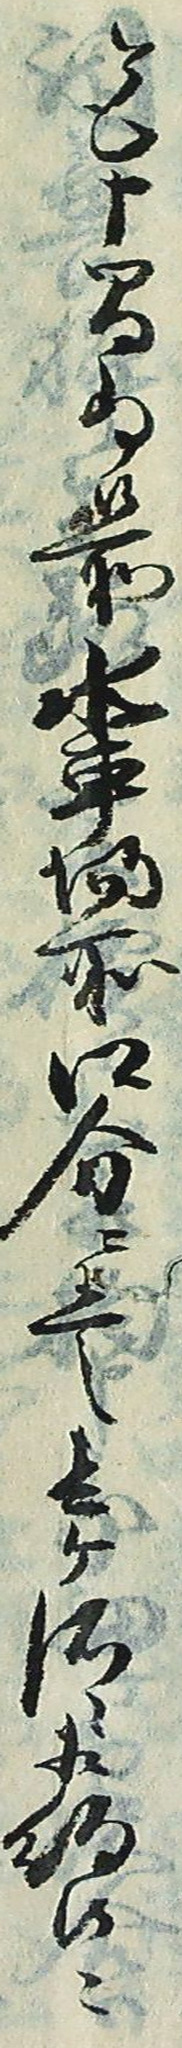とも申間布候所水車場所郷分に有之壱ケ所に相約候に
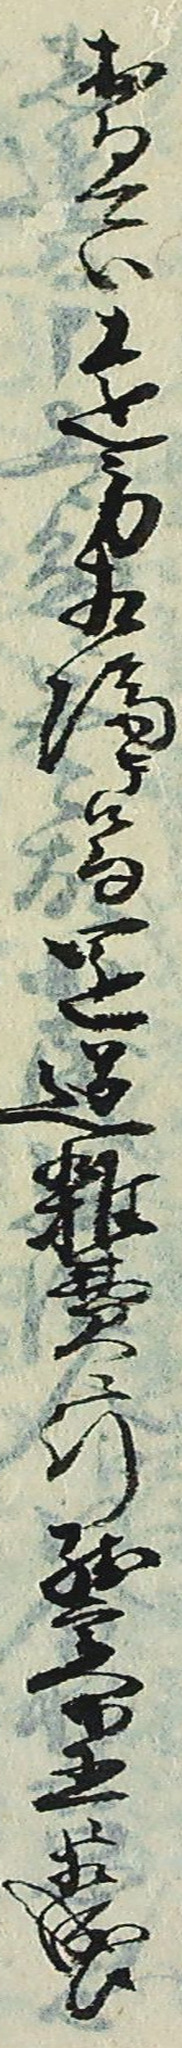おゐては遠方相隔て候而運送雑費に引残実下直に相成候
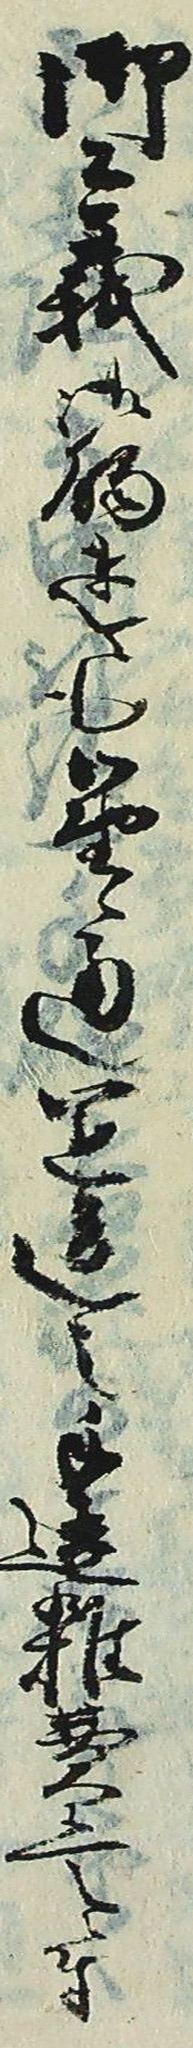御公儀御触達にも御坐候通運送之手違雑費有之に付
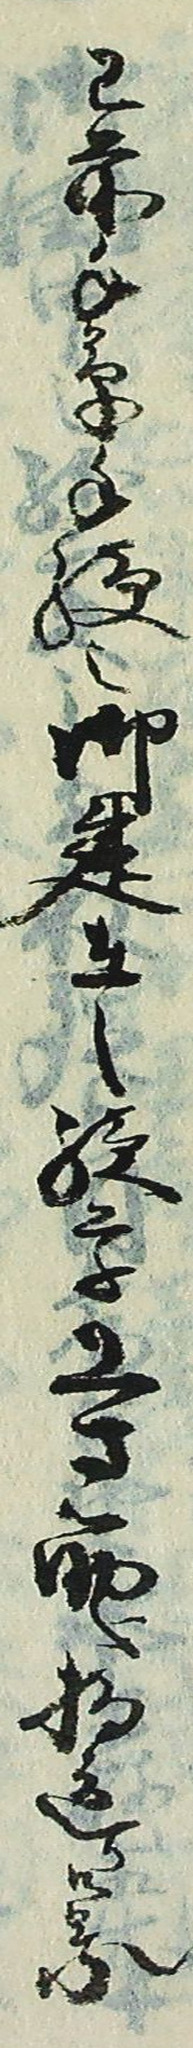已前手草手絞之御建在之絞草上方筋へ指送り候義
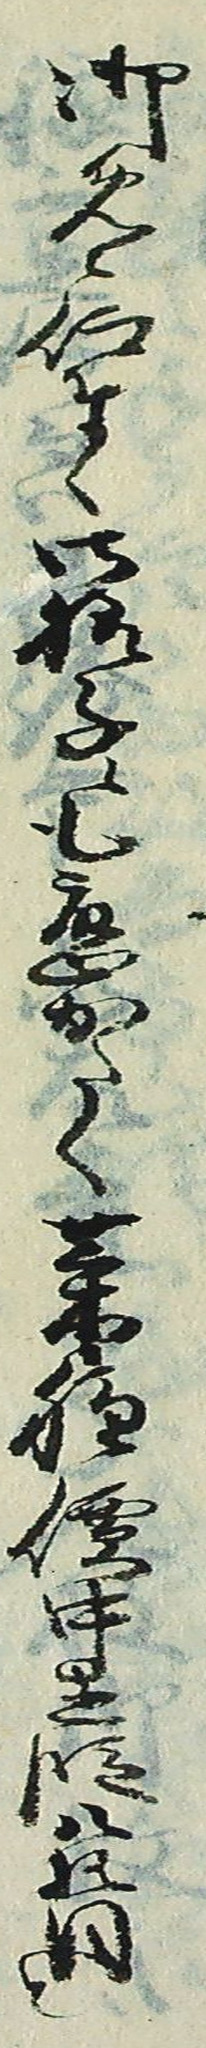御免被仰付候御様子にも応かたく菜種価中直段八拾目と
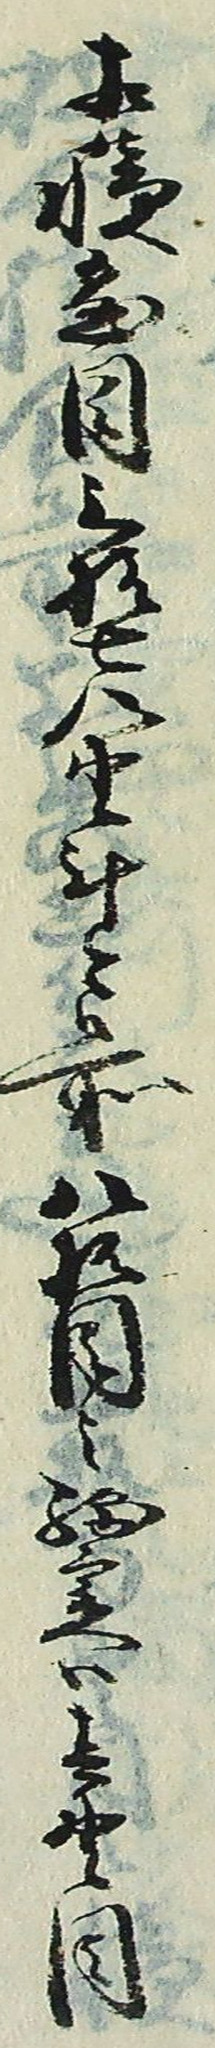相積懸目三拾七八貫計に候所八拾目之綿実は壱貫目
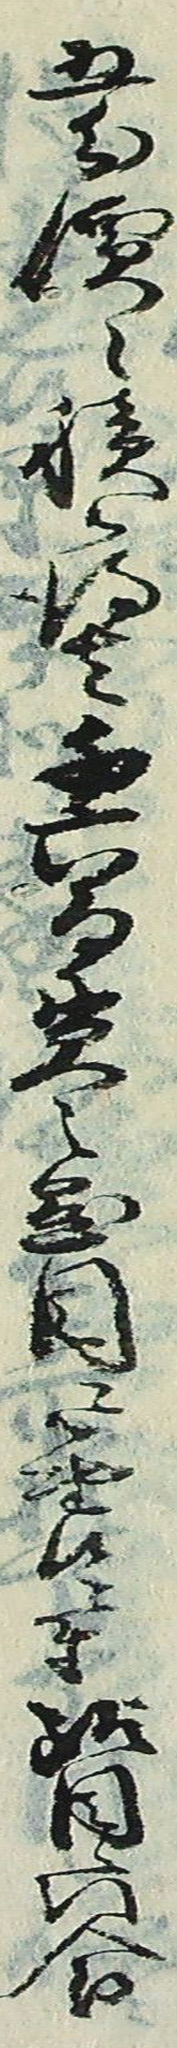五分価に積候得者千六百貫之懸目に御坐候に付銀目に引合
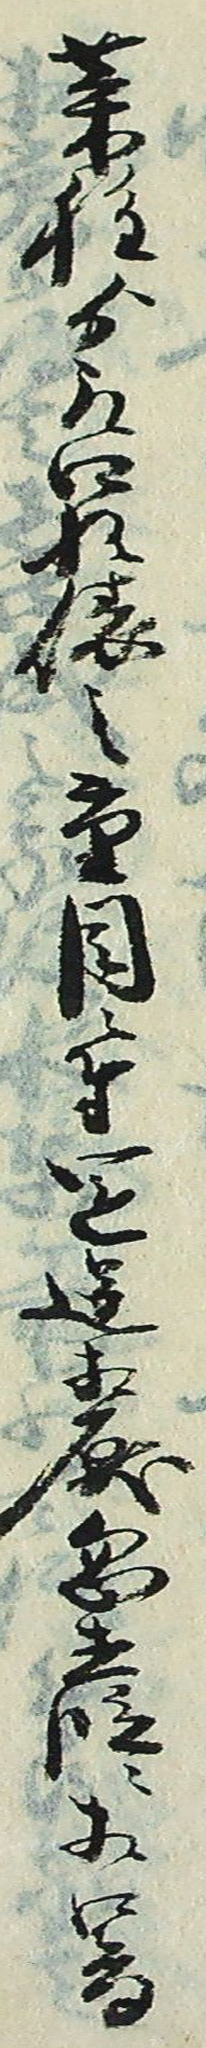菜種ゟ凡四拾俵之重目に付運送相厭忽直段に相響
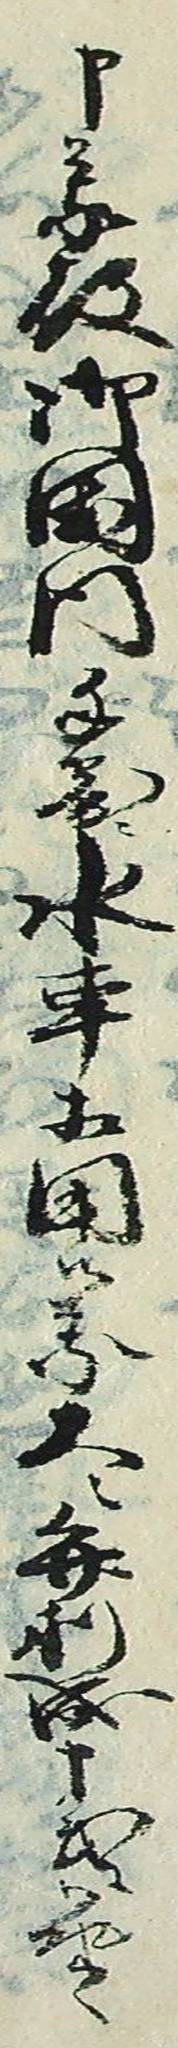申義故御国内手寄に水車相用候義大に弁利成申義に御坐候
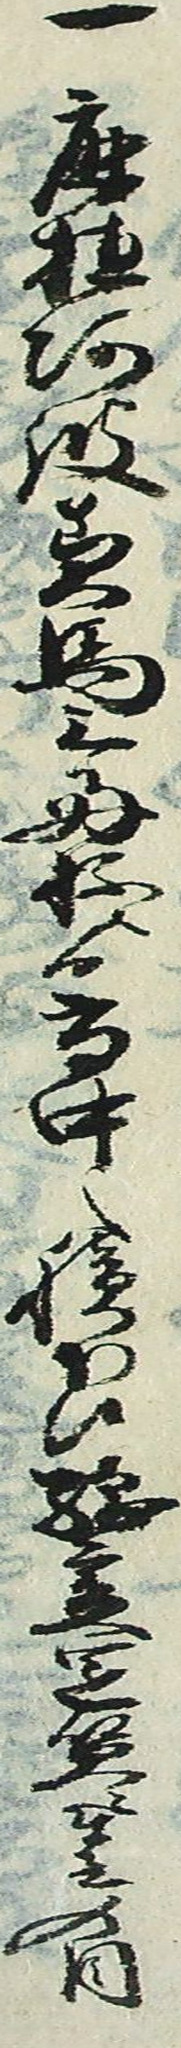一麻植阿波美馬三好抔ゟ市中へ積下候綿実運賃に付壱〆目
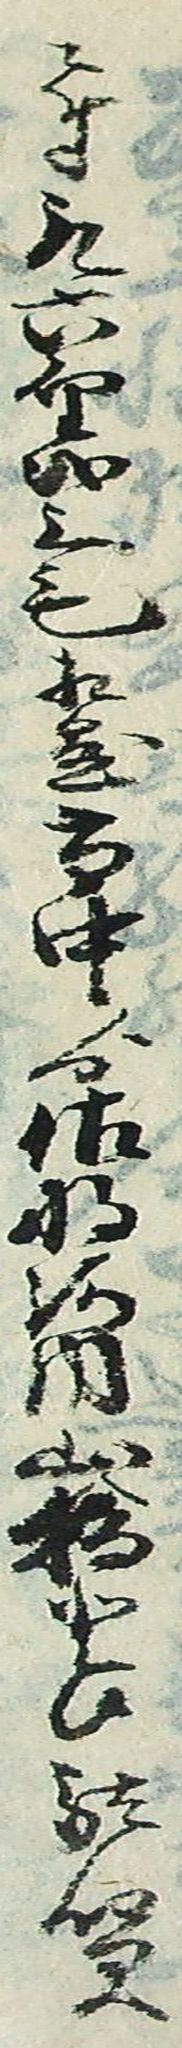に付凡六厘弐三毛相懸市中ゟ佐那河内山へ指登候駄賃
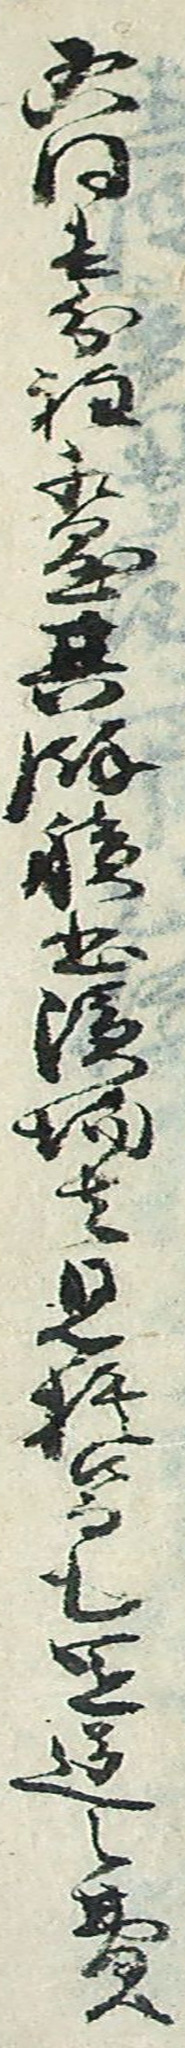右同壱分程相懸其余積出浜場者見捨候而も運送之費

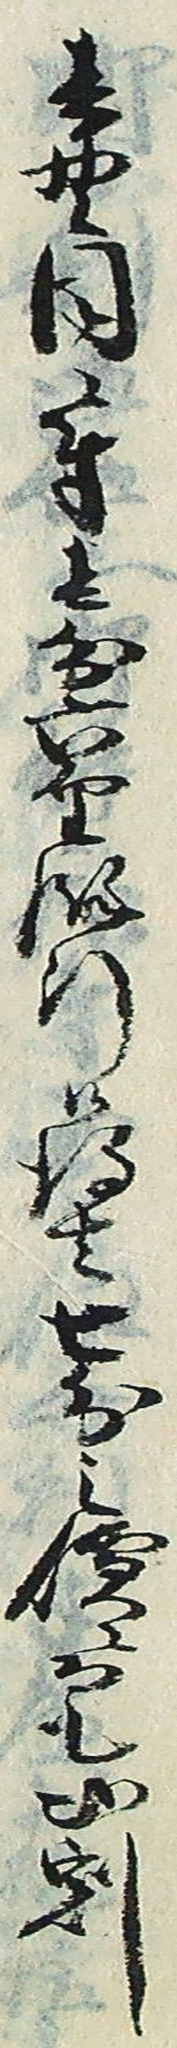壱貫目に付壱分六厘余引候得者七分之価に而も弐割
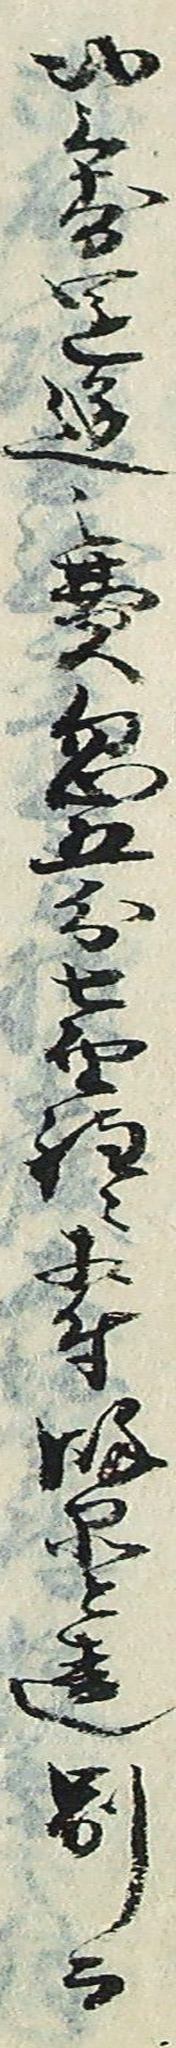弐三歩運送之費忽五分七厘程に相付余品と違別而
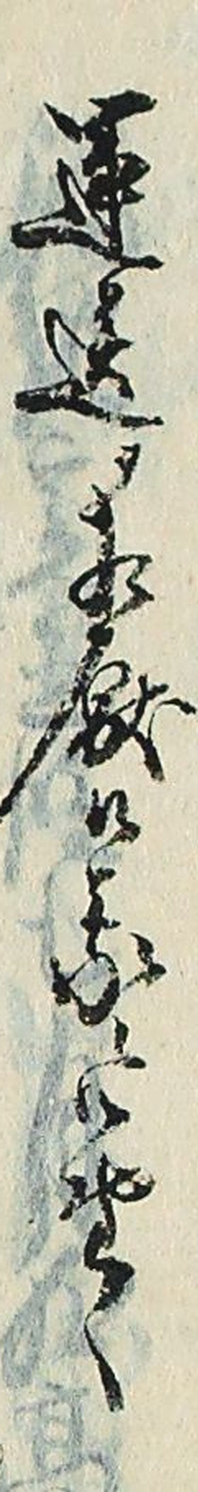運送を相厭候義に御坐候
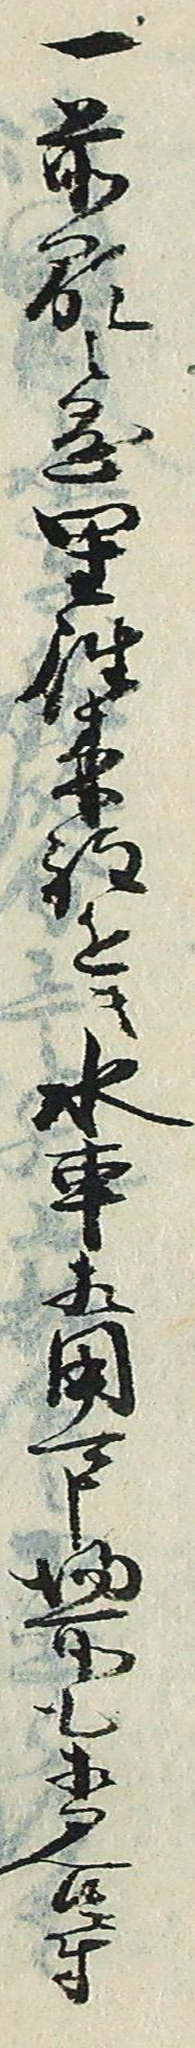一前顕之懸里往来程近き水車相用可申場所も相見候に付
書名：油稼御取究ニ附御箇條書テ以被仰渡南北同役申談御答書控
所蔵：鳴門教育大学 Naruto University of Education
